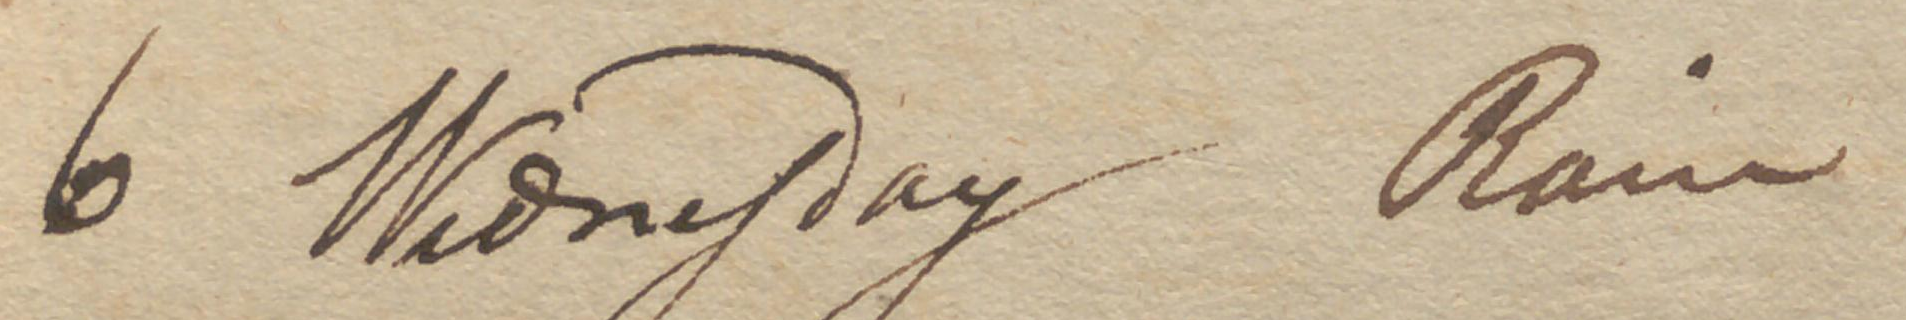6 Wednesday Rain
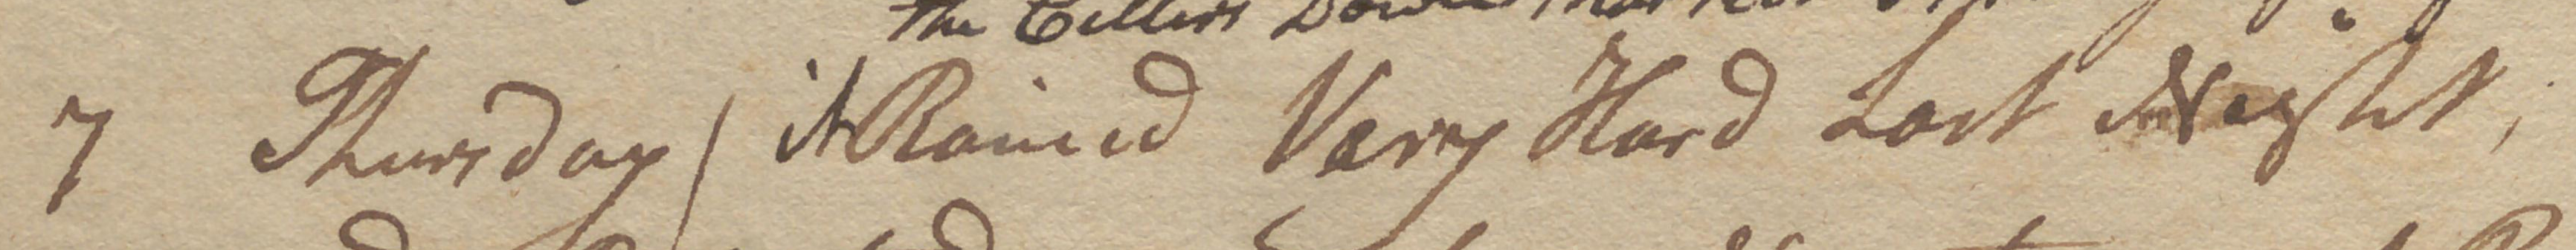7 Thursday / it Rained Very Hard Last Night,
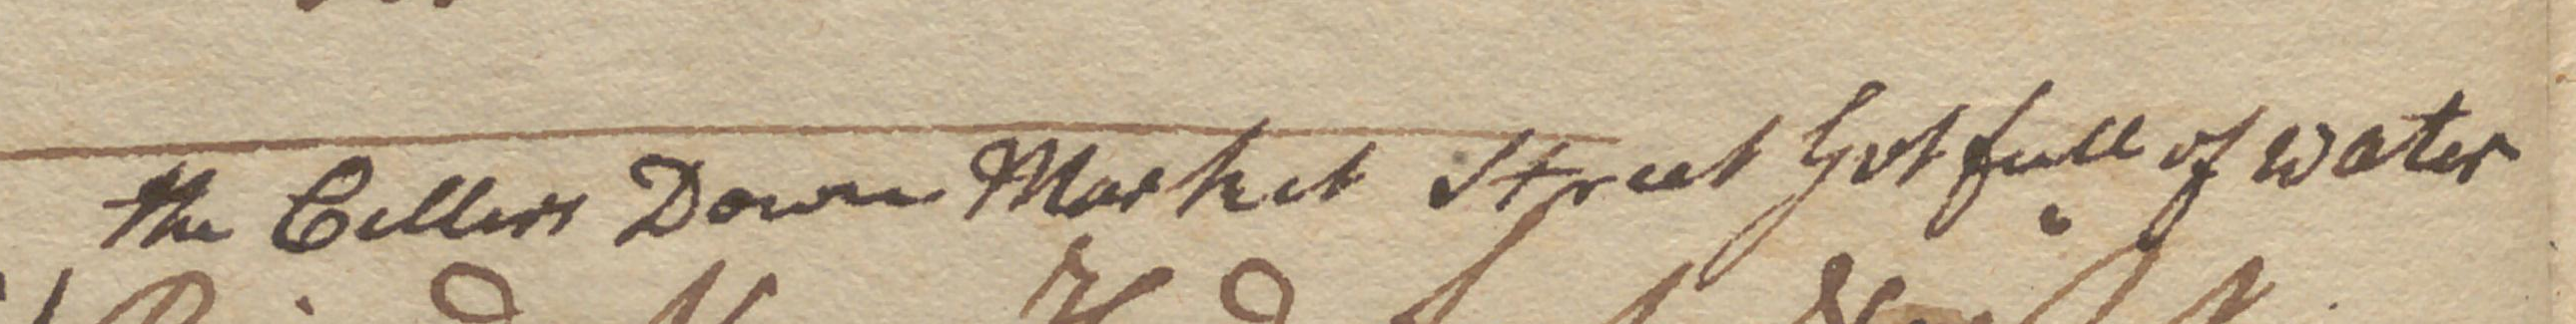the Cellers Down Market street Got full of water
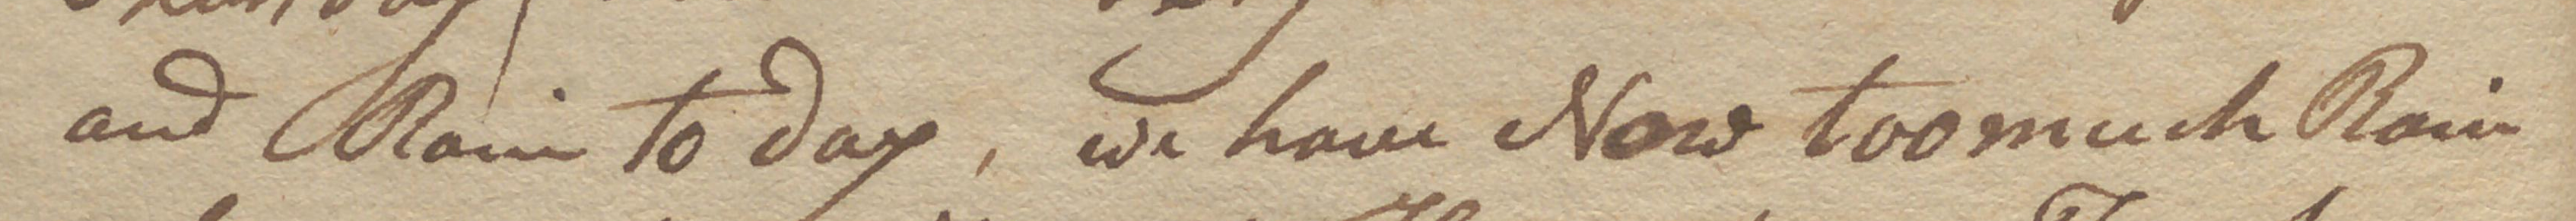and Rain to day, we have Now too much Rain
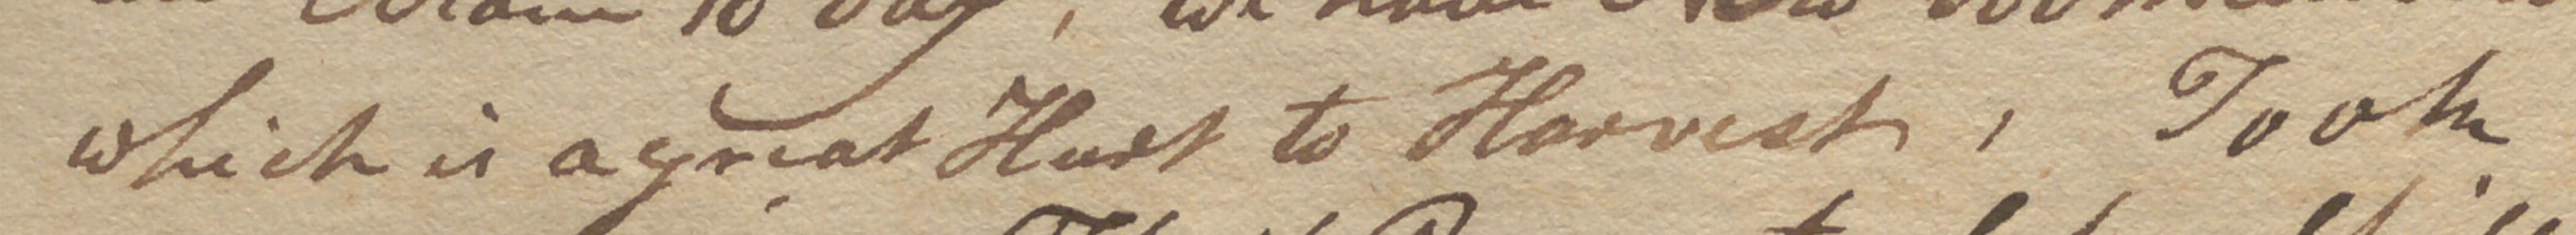which is a great Hurt to Harvest, Took
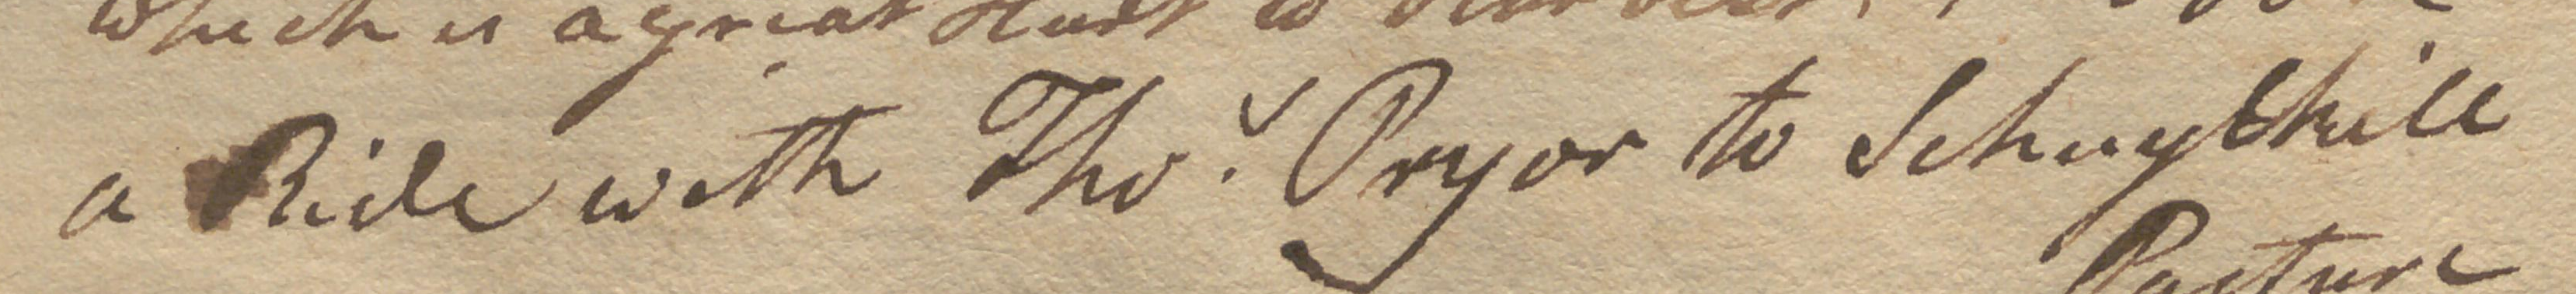a Ride with Tho^s. Pryor to Schuylkill
